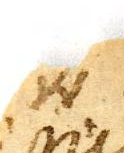4
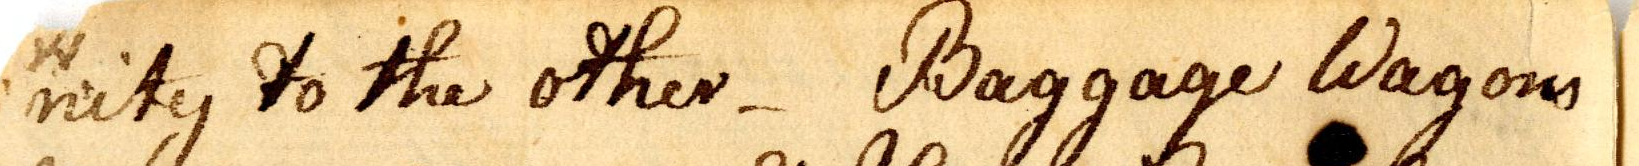nity to the other- Baggage Wagons
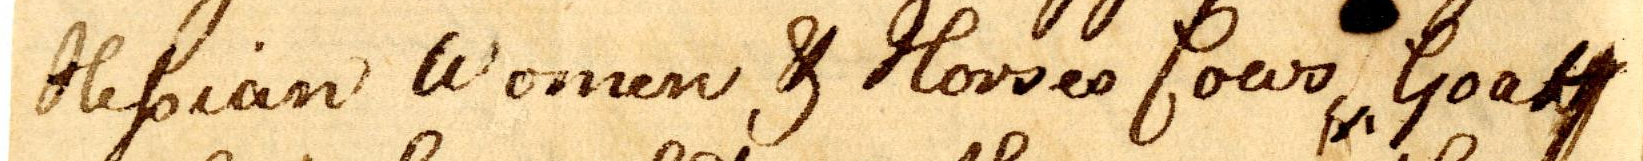Hessian Women & Horses Cows, Goats
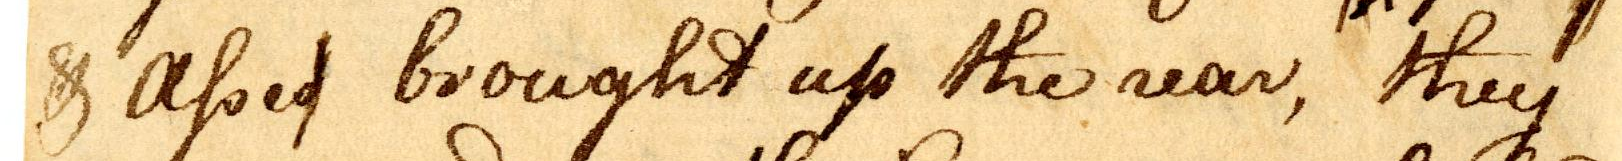& Asses brought up the rear, they
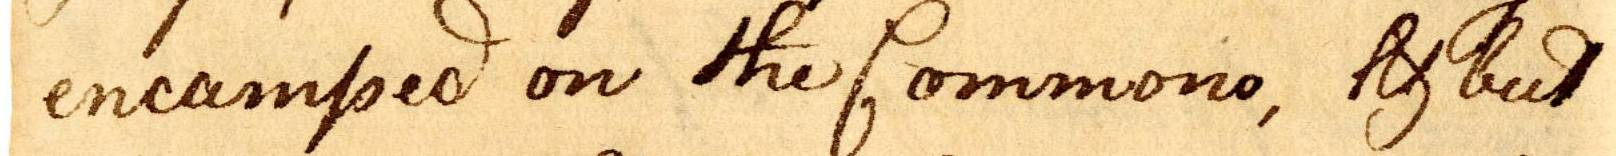encamped on the Commons, & but
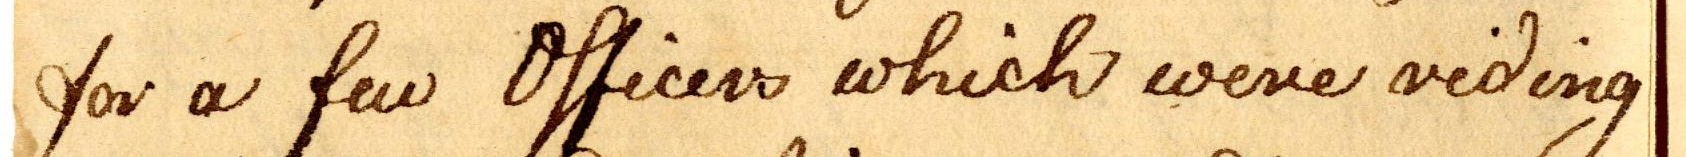for a few Officers which were riding
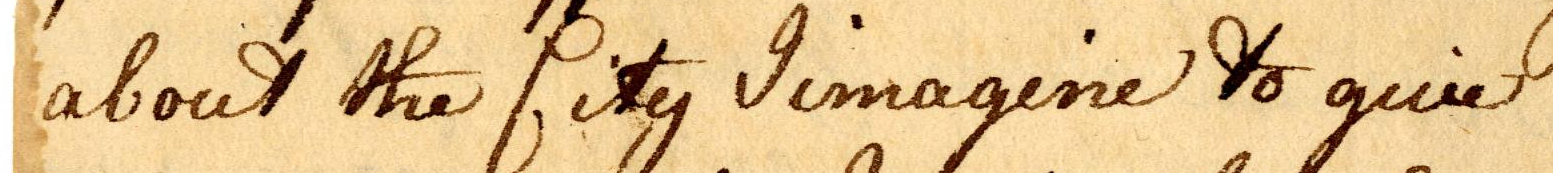about the City I imagine to give
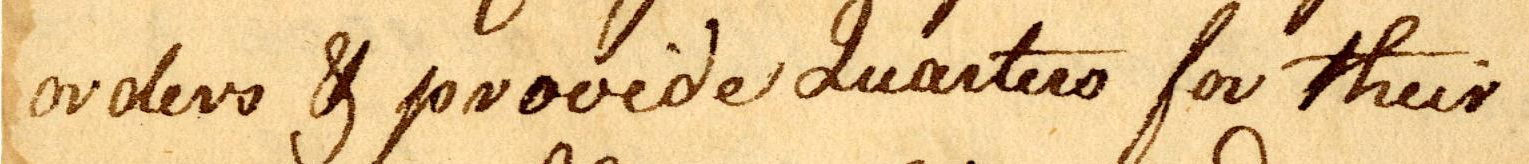orders & provide Quarters for their
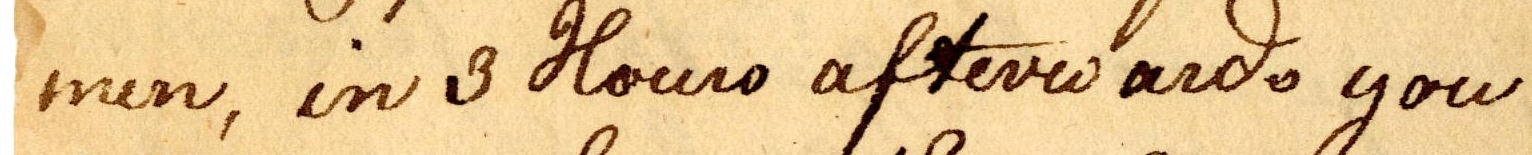men, in 3 Hours afterwards you
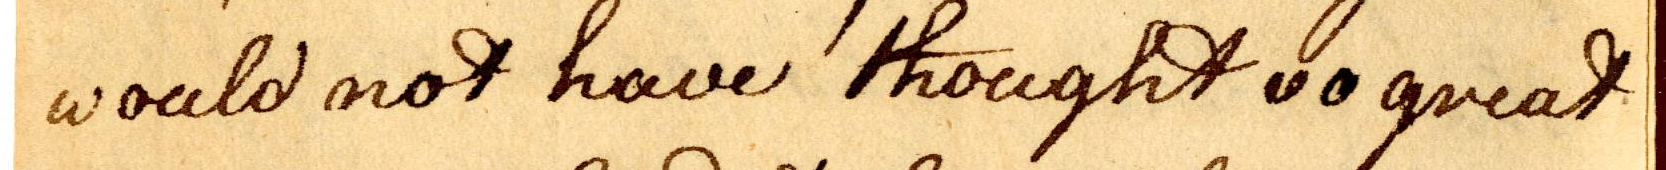would not have thought so great
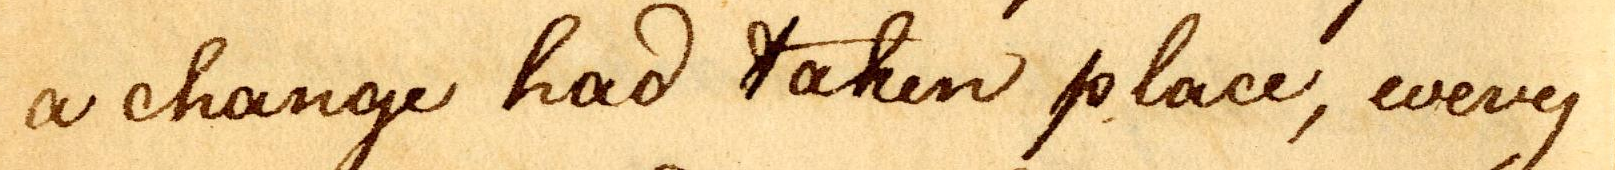a change had taken place, every
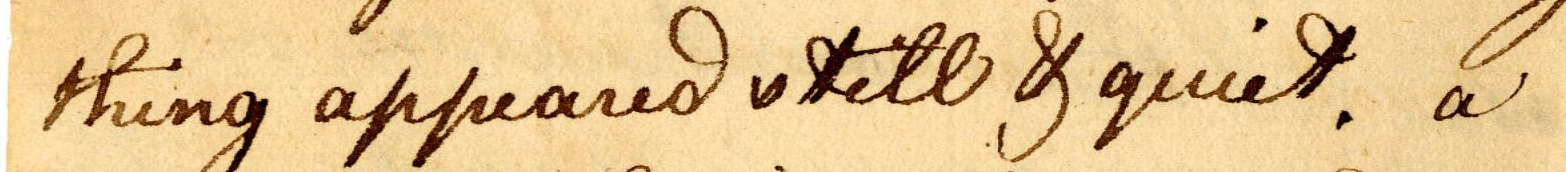thing appeared still & quiet, a
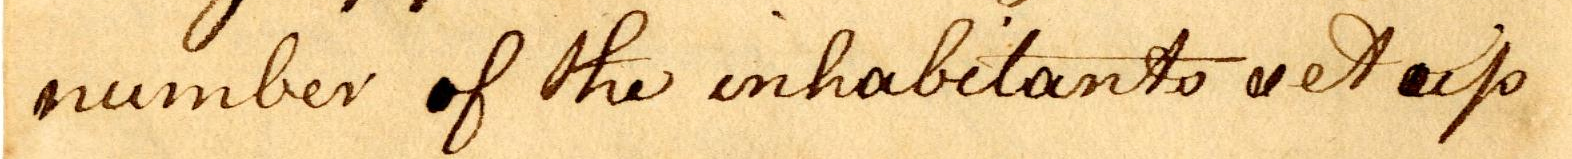number of the inhabitants set up
